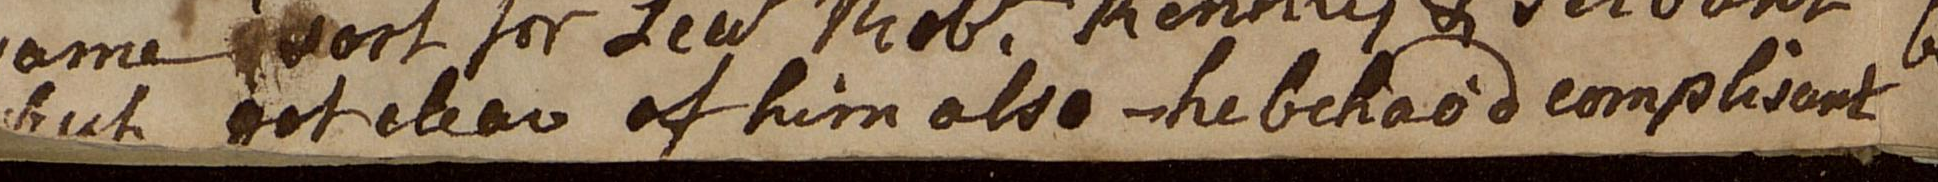but not clear of him also- he behav'd complisant
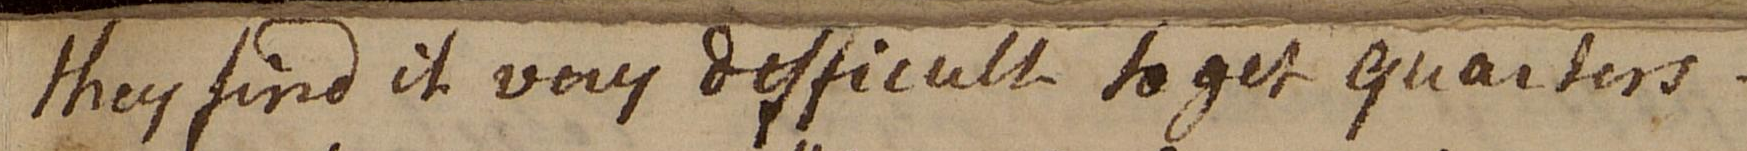they find it very difficult to get quarters-
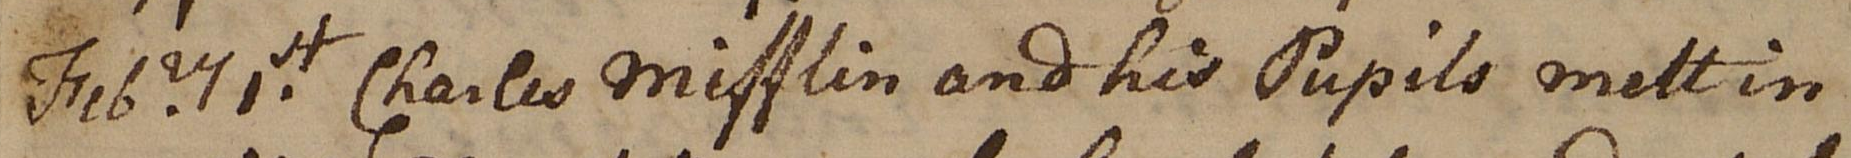Feb^ry. 1^st. Charles Mifflin and his Pupils mett in
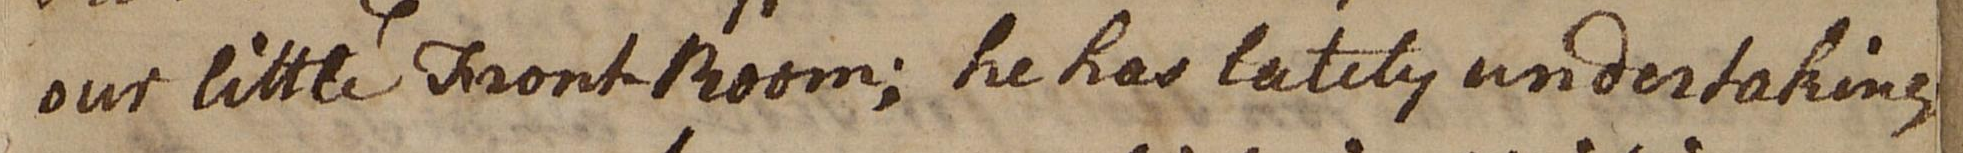our little Front Room; he has lately undertaking
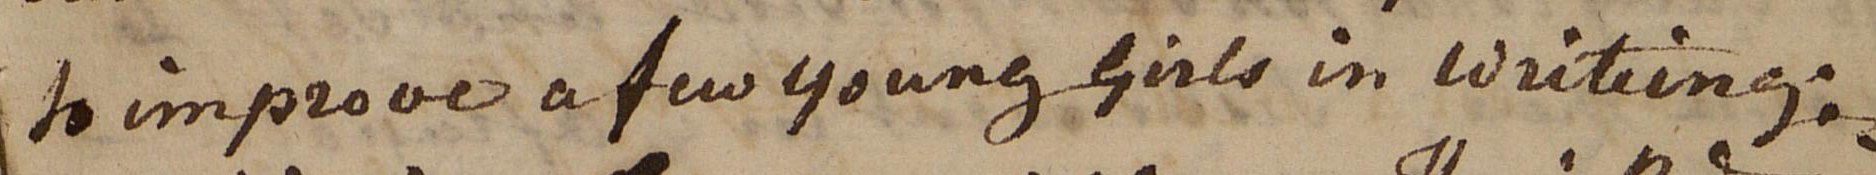to improve a few young Girls in Writeing:
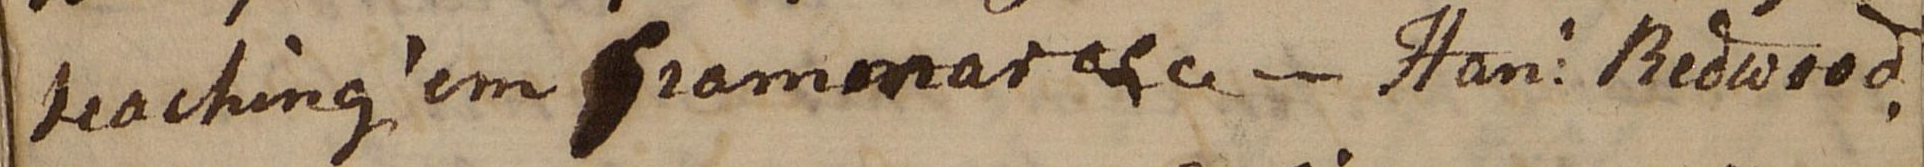teaching 'em grammar &c- Han: Redwood,
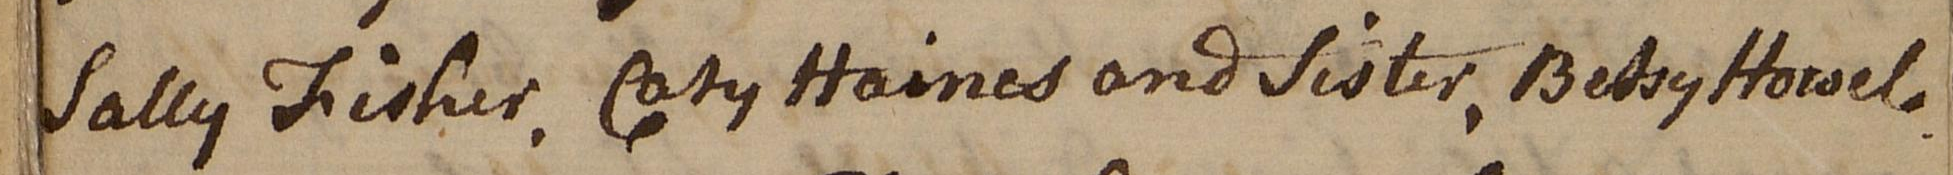Sally Fisher, Caty Haines and Sister, Betsy Howel
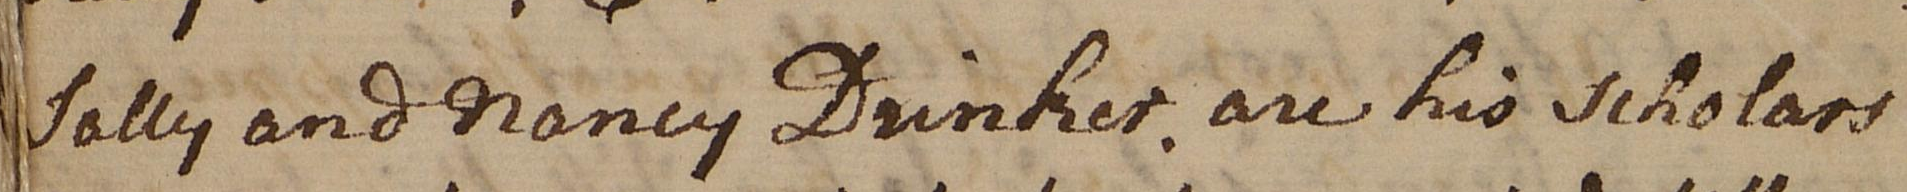Sally and Nancy Drinker, are his scholars
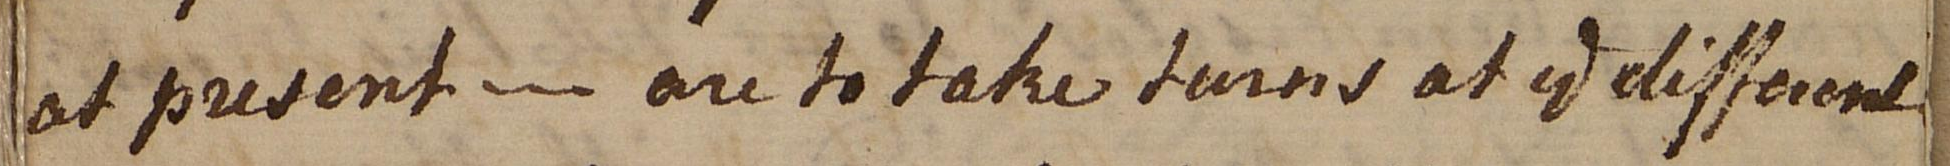at present- are to take turns at y^e different
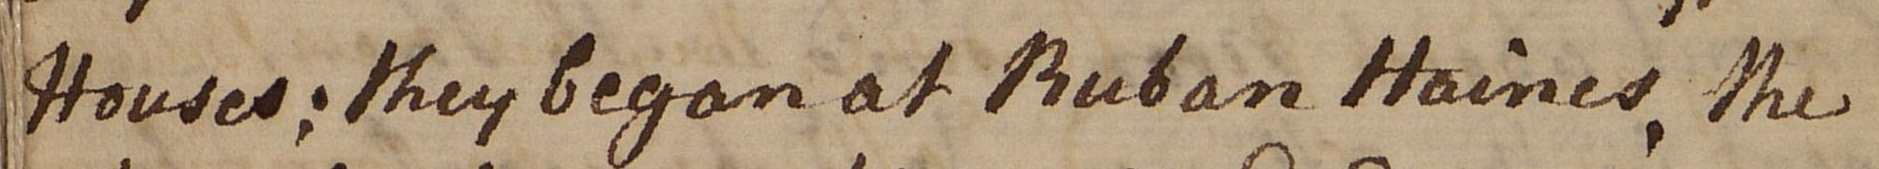Houses; they began at Ruban Haines, the
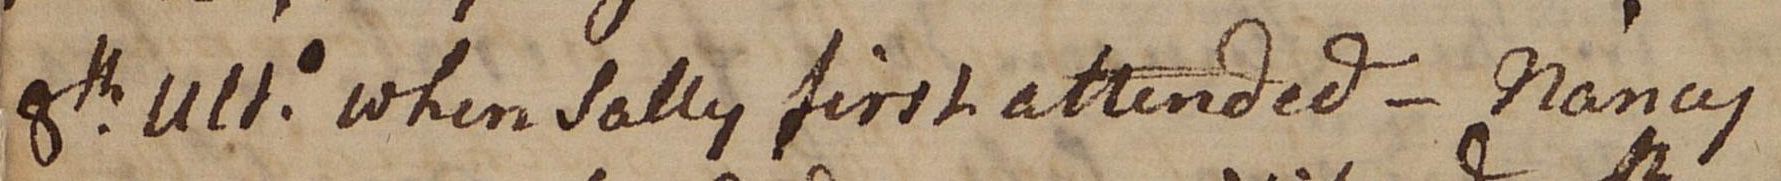8^th Ult^o. when sally first attended- Nancy
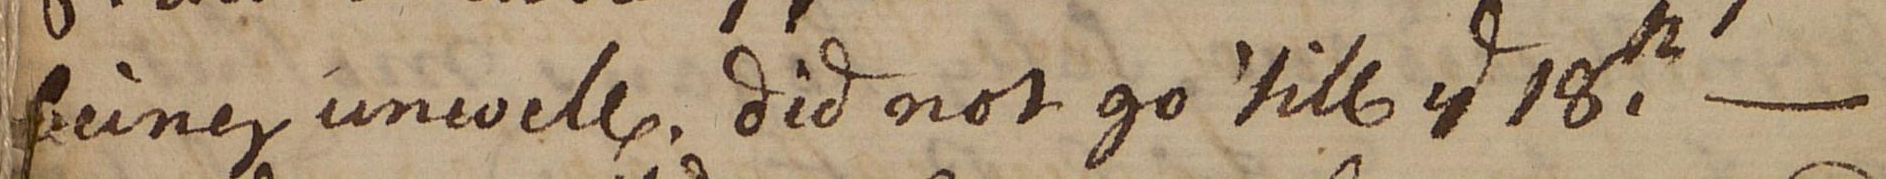being unwell, did not go 'till y^e 18^th.-
